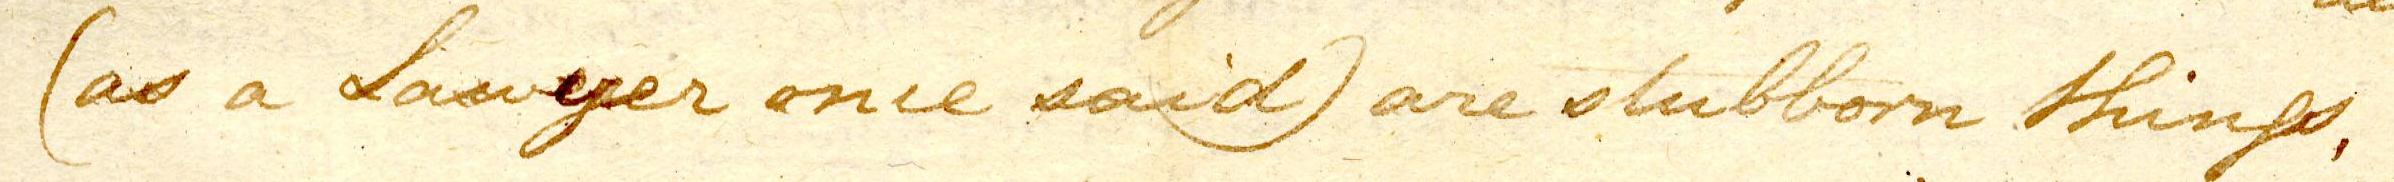(as a Lawyer once said) are stubborn things,
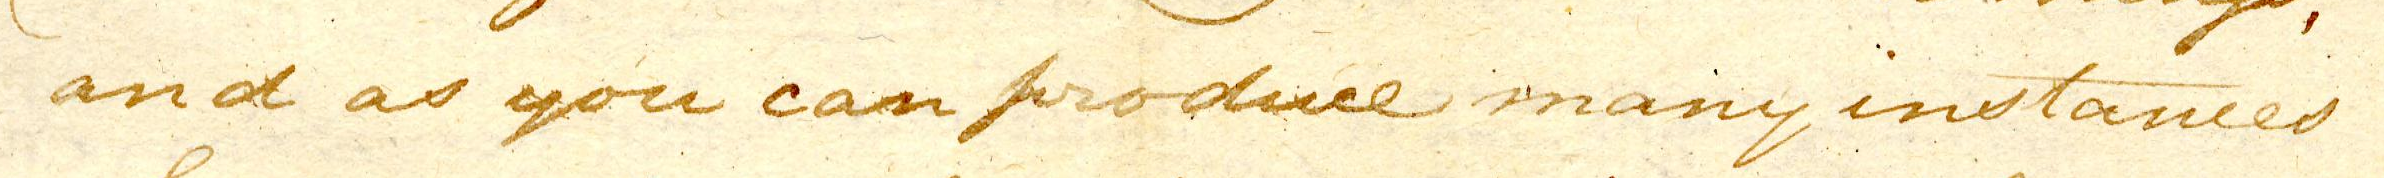and as you can produce many instances
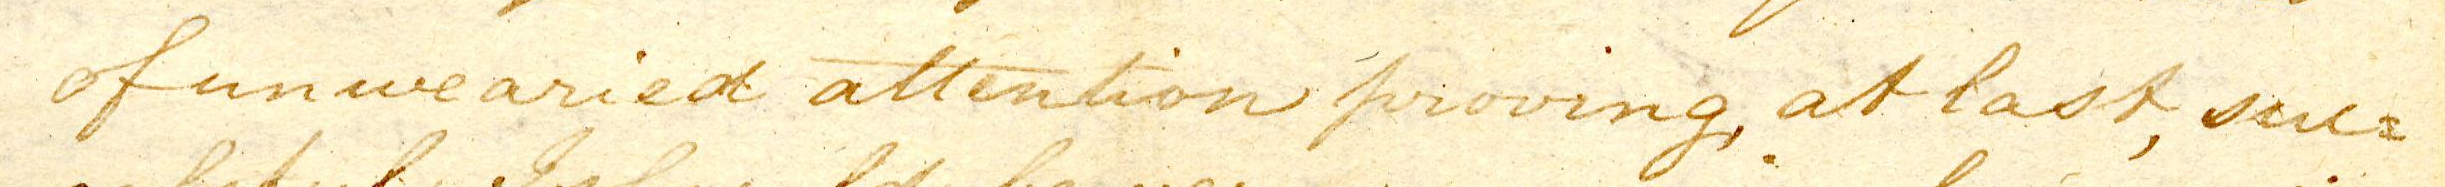of unwearied attention proving, at least, suc-
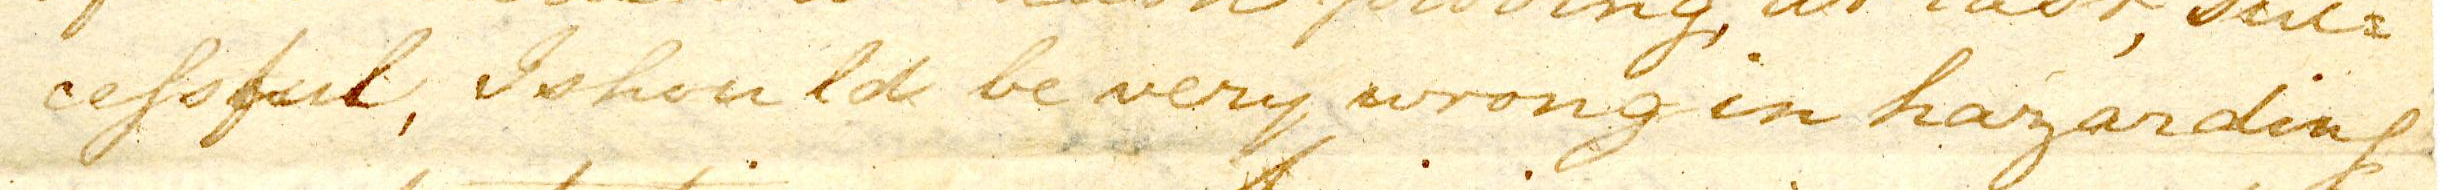cessful, I should be very wrong in hazarding
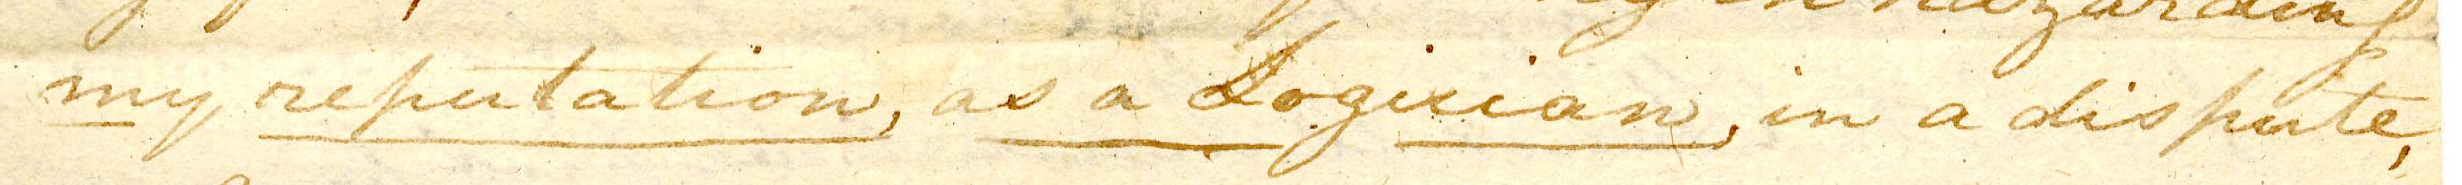my reputation, as a Logician, in a dispute,
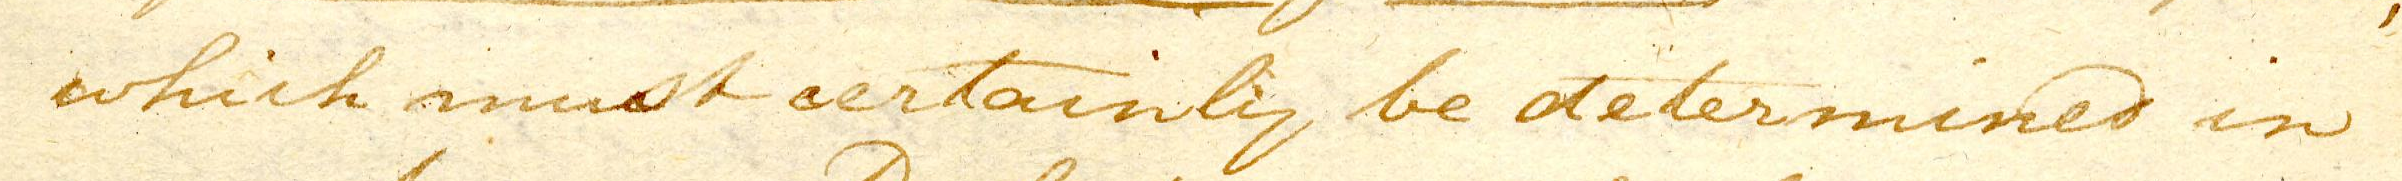which must certainly be determined in
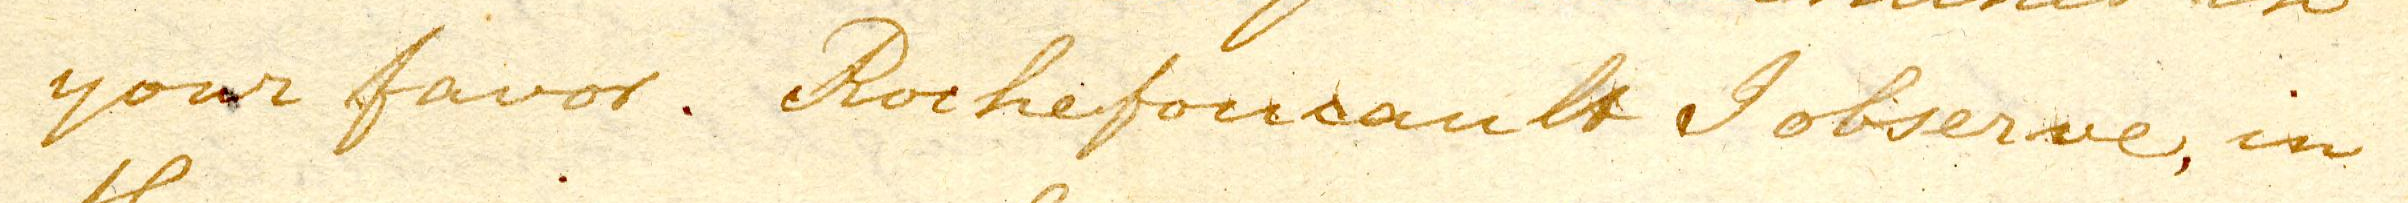your favor. Rochefoucault I observe, in
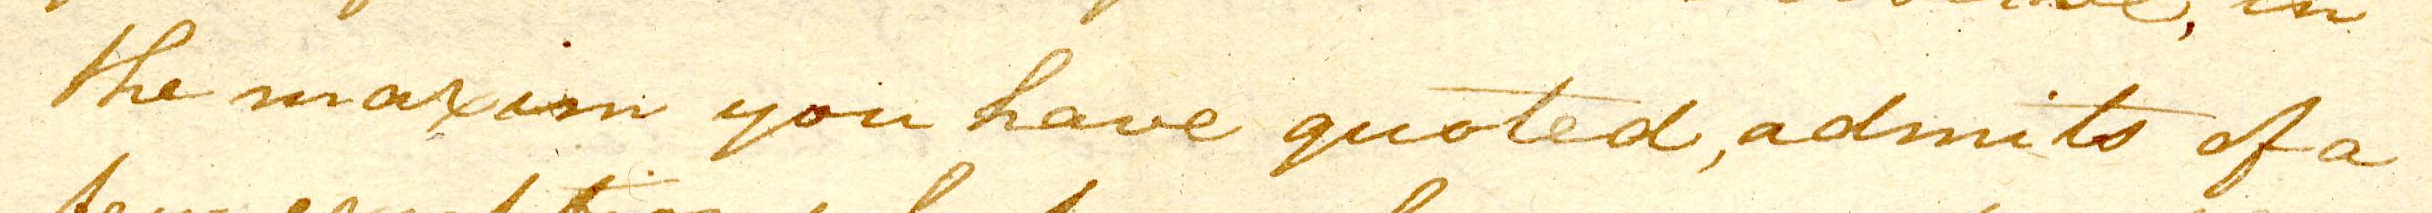the maxim you have quoted, admits of a
